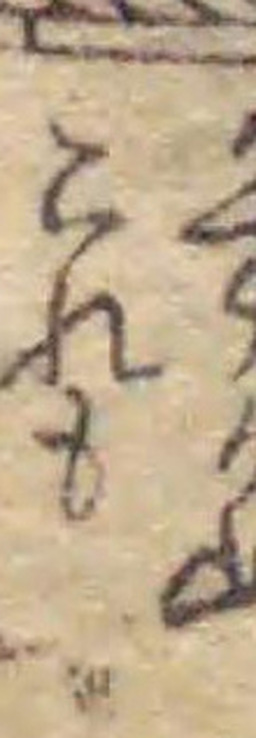これも
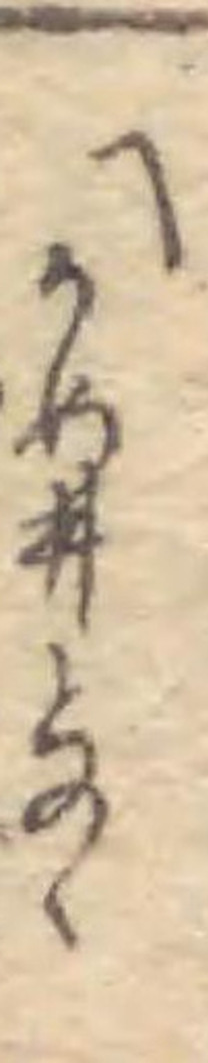〽かめ井とのゝ
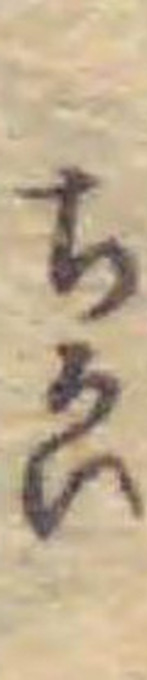ちかい
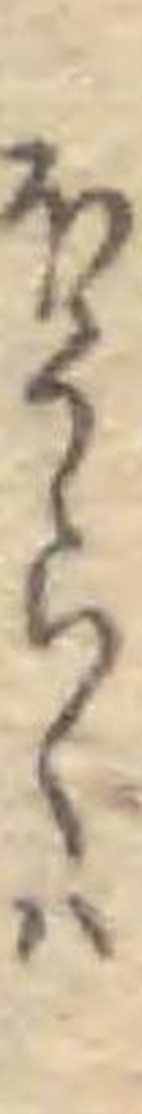ほうらくは
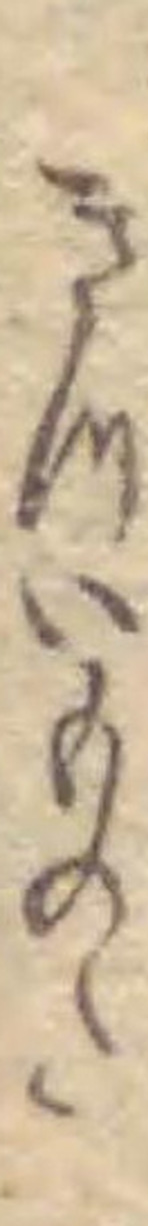きついものた
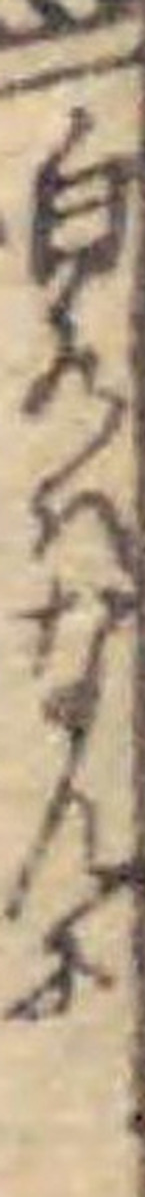白水はなんに
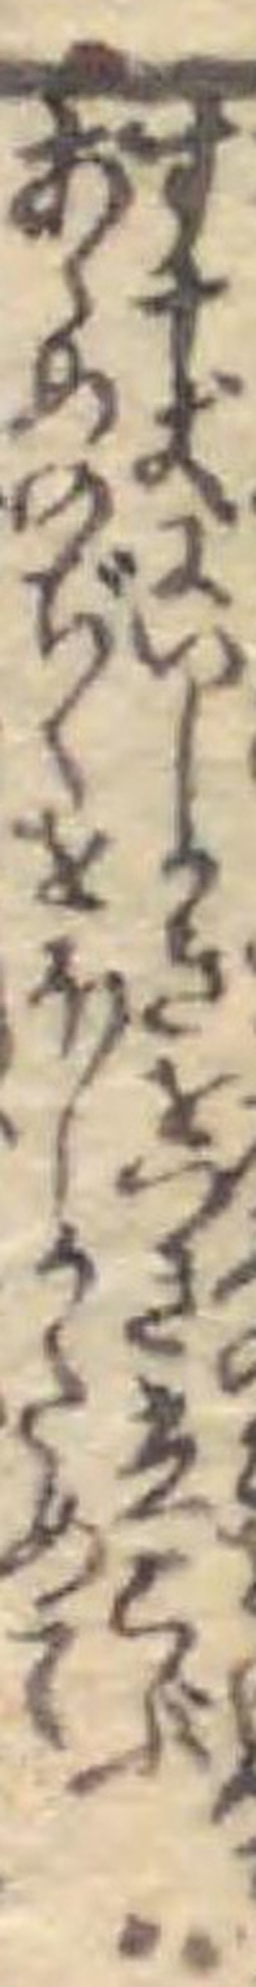あらめのぢくをほしかためて
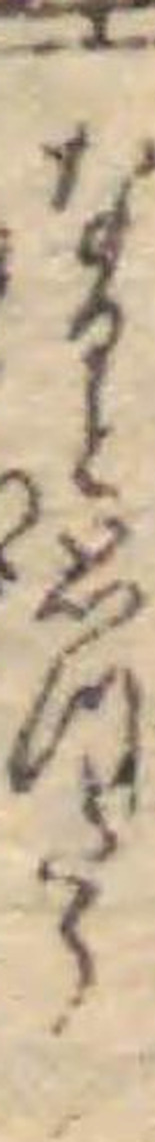なると思つたら
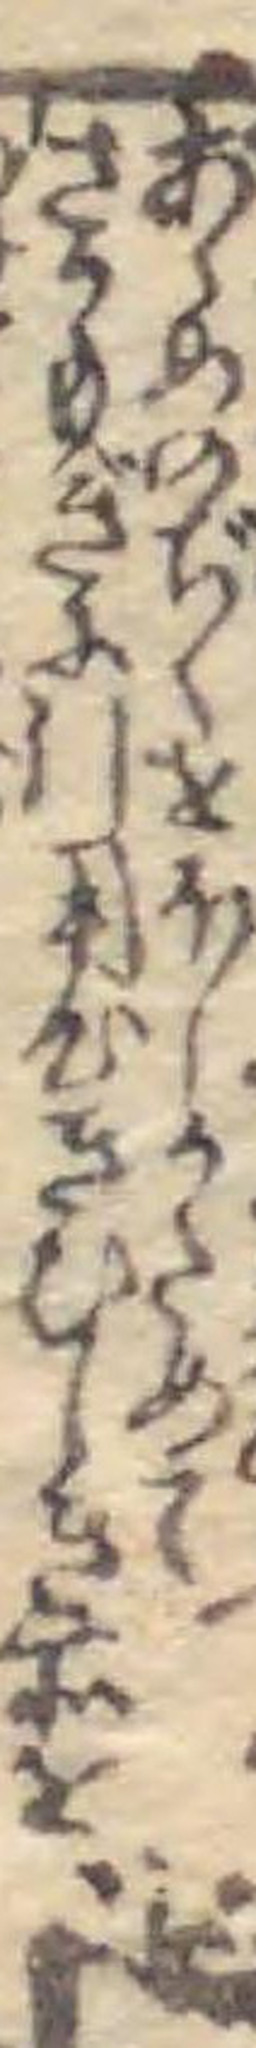さかもぎに引用こゝろきひしき所を
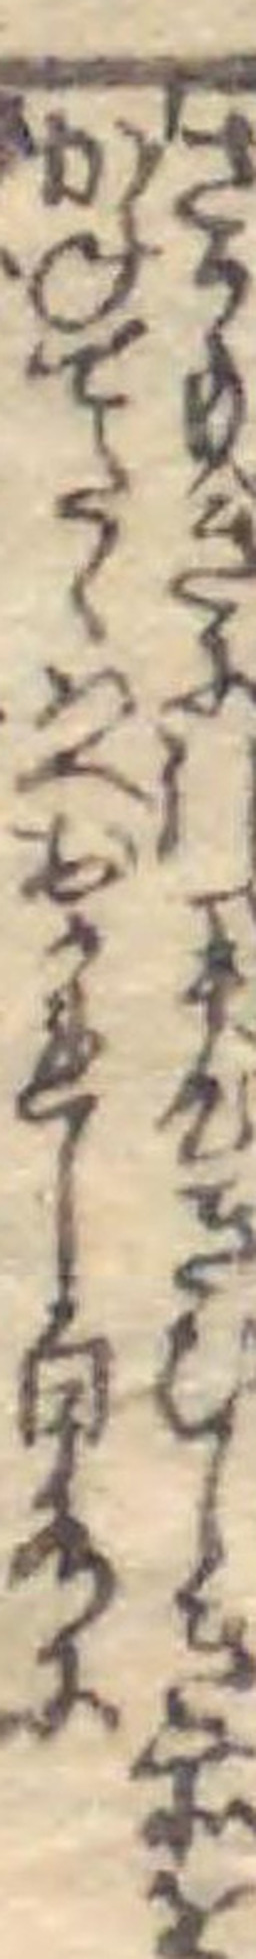かねてたくはへおかれし白水に
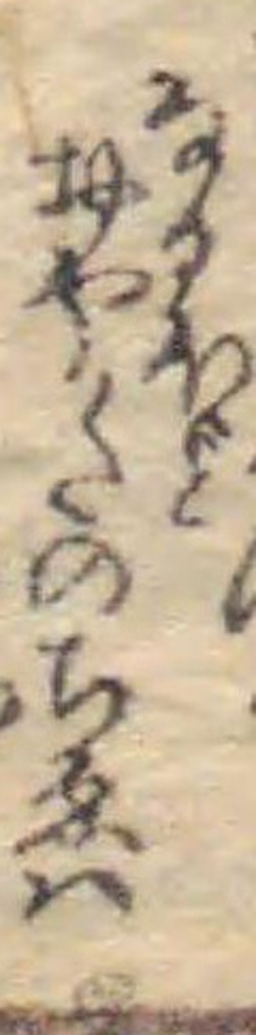おやかたのちゑは
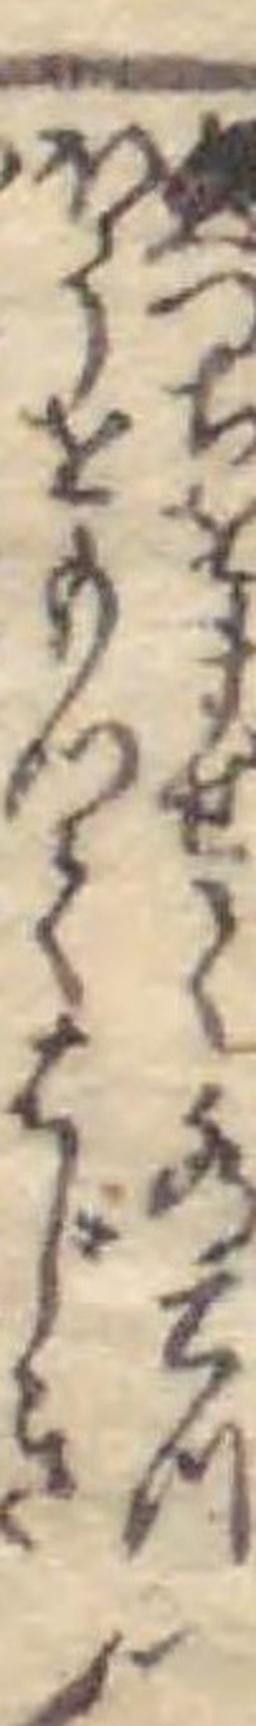ほうをもつてはじき
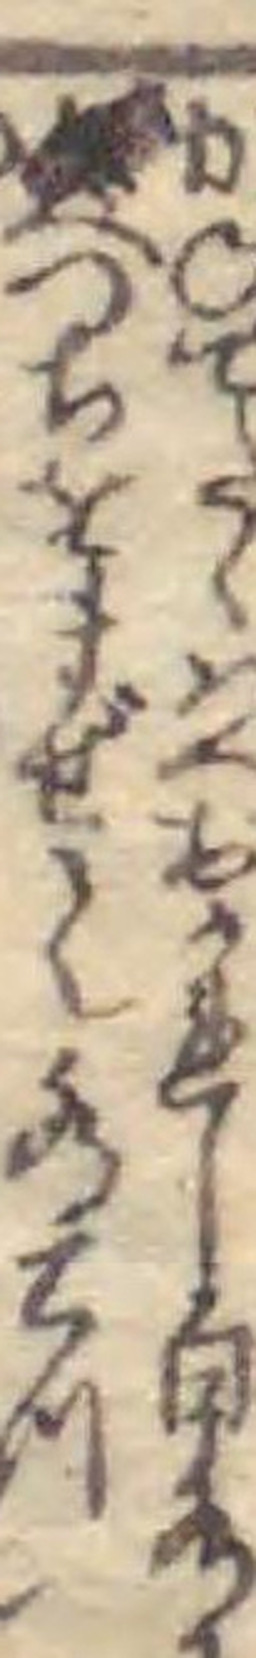かへつちをまぜて水てつ
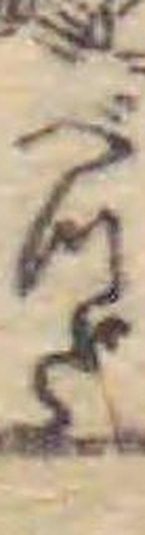べつだ
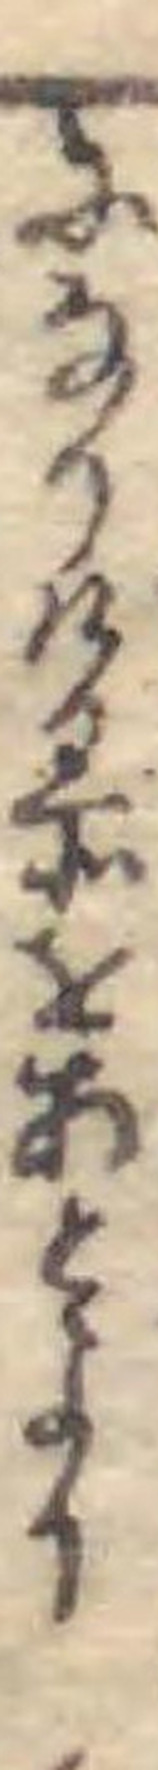になりける所をあとより
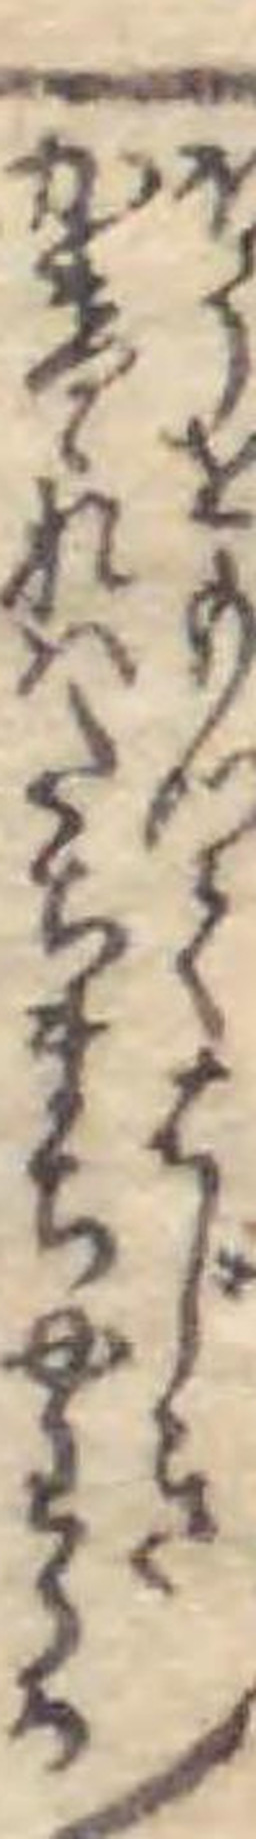かけゝれはたちまちやわらか
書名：悦贔負蝦夷押領 : 3巻
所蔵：国立国会図書館 National Diet Library, JAPAN
